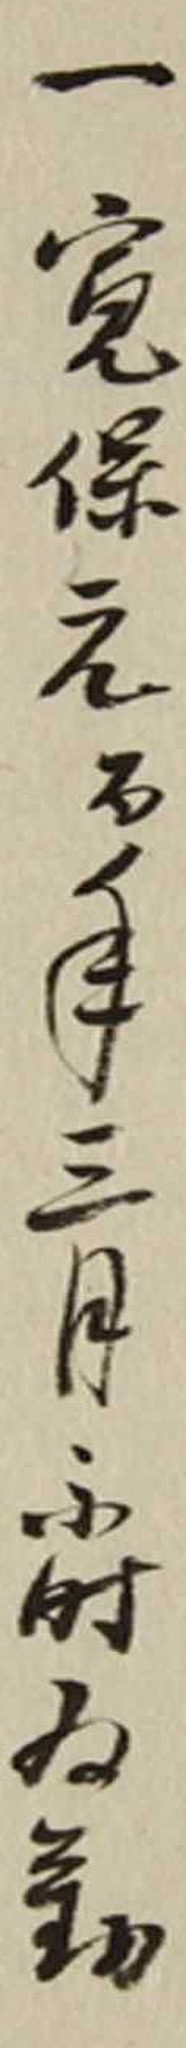一寛保元酉年三月不時為勤
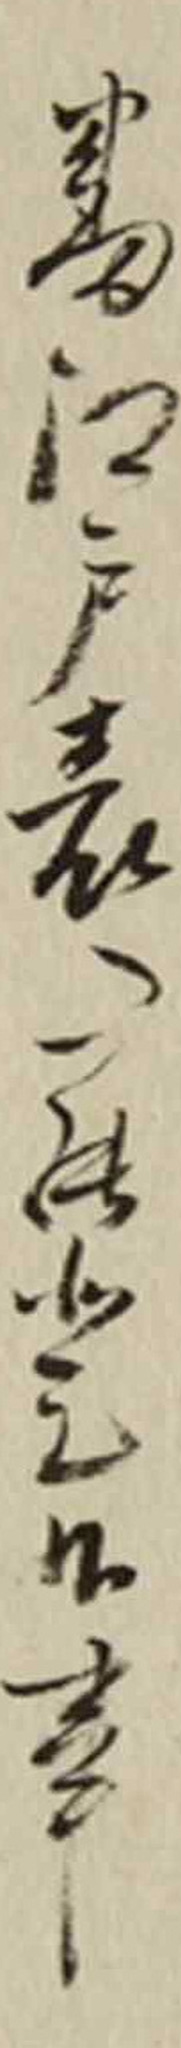番江戸表へ罷登候事
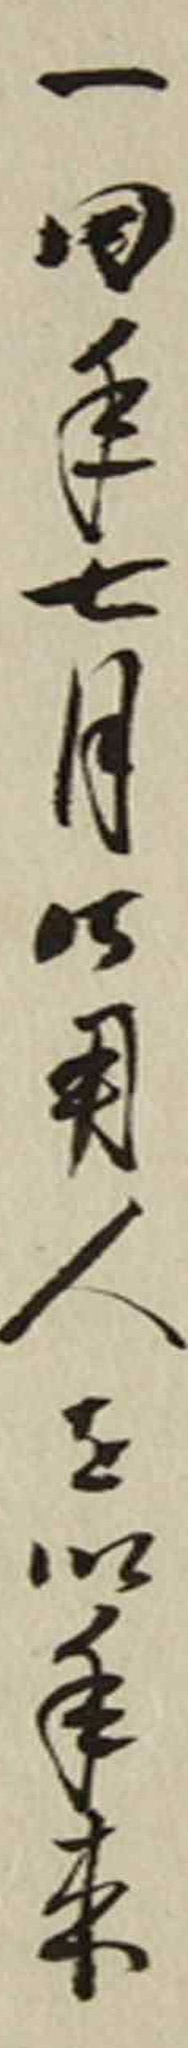一同年七月御用人を以年来
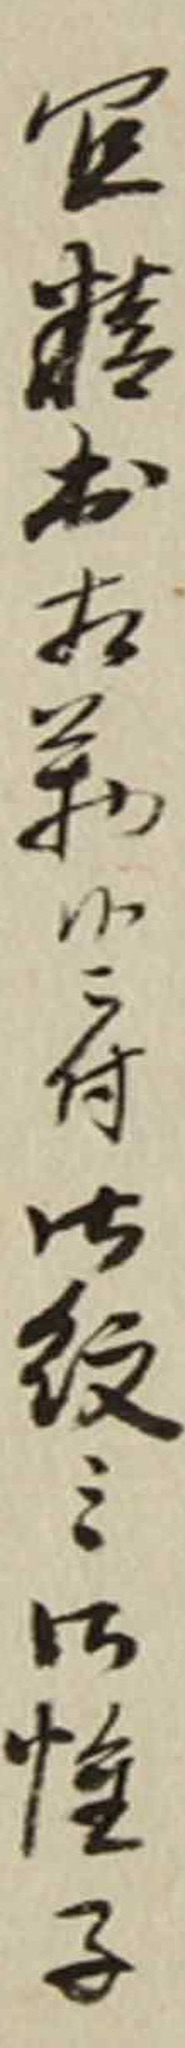宜精出相勤候ニ付御紋之御帷子
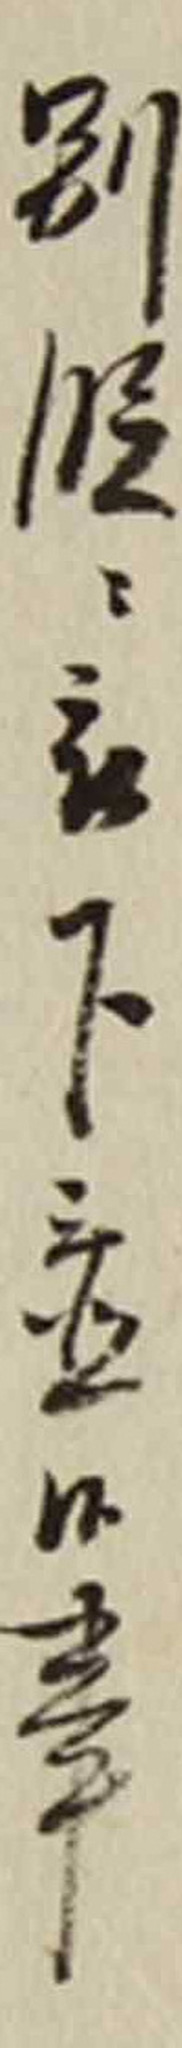別段ニ被下置候事
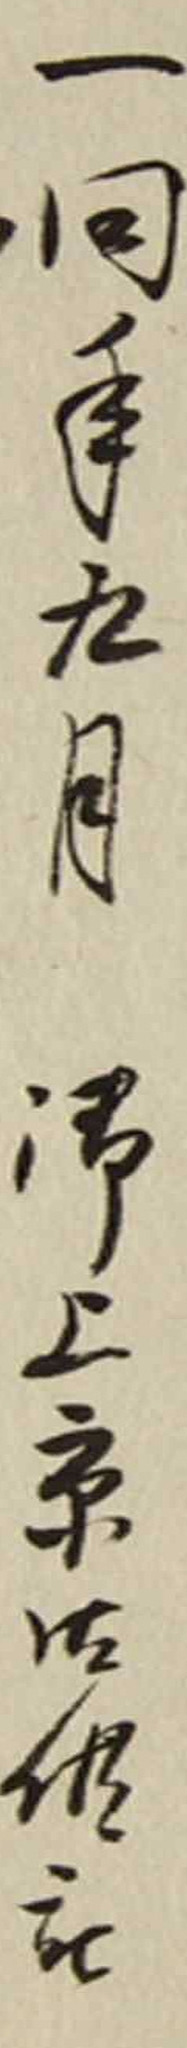一同年九月御上京御供被
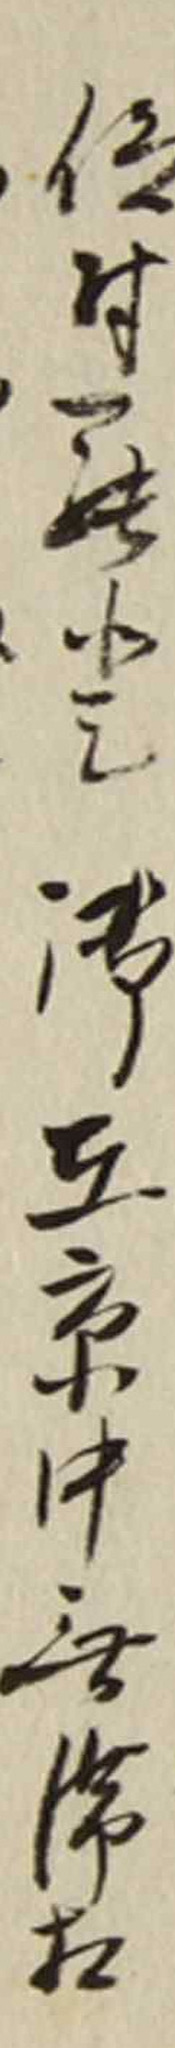仰付罷登御在京中無滞相
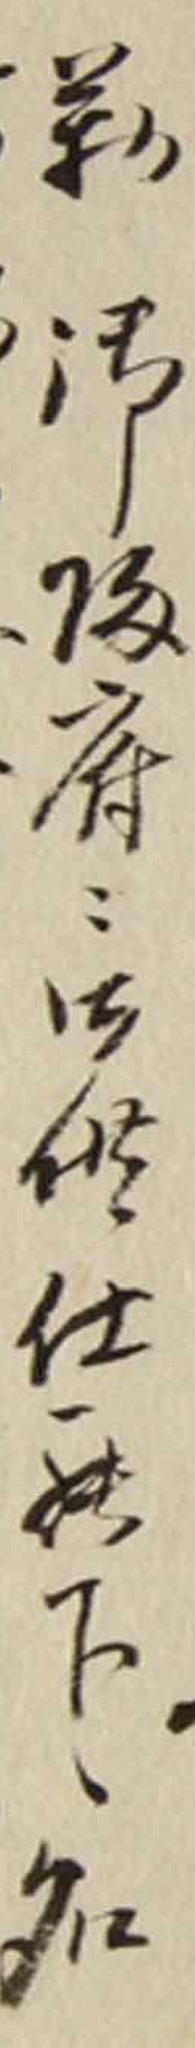勤御帰府ニ御供仕罷下候処
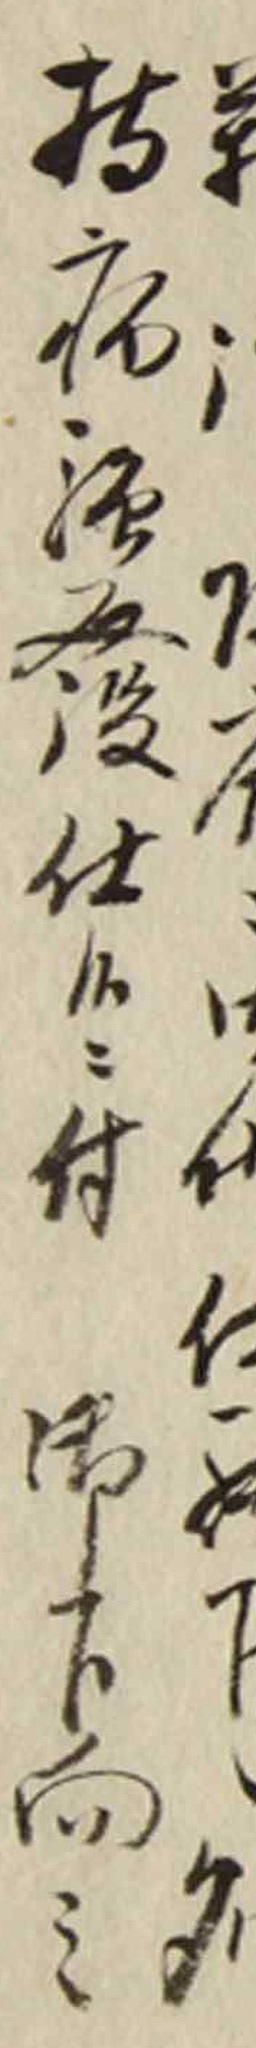持病強発仕候ニ付御下向之

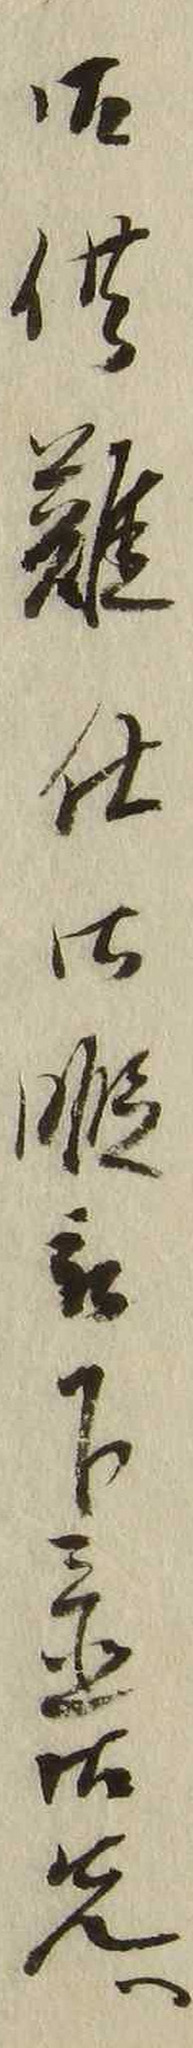御供難仕御暇被下置御先へ
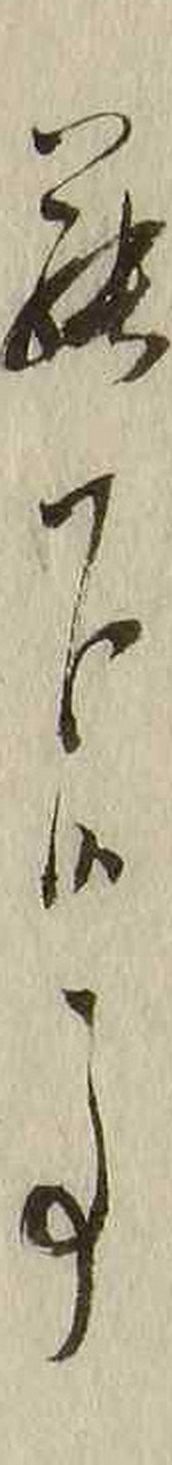罷下候事
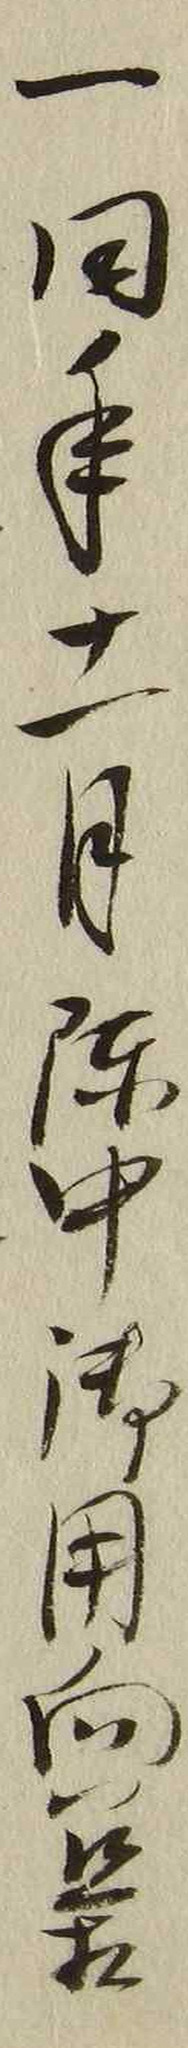一同年十一月陣中御用向宜相
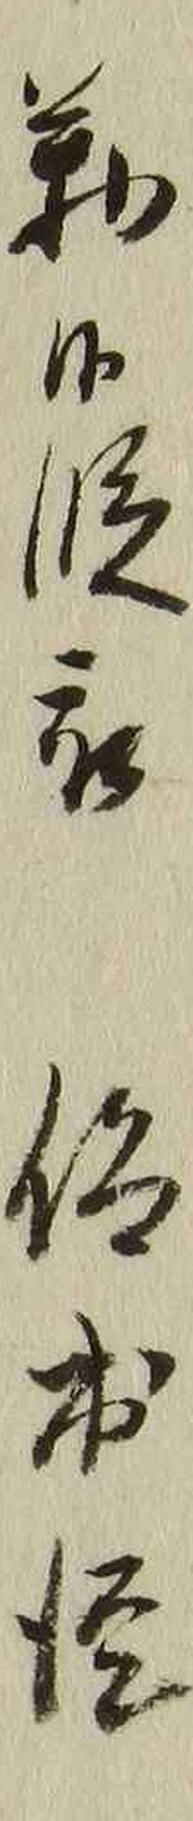勤候段被仰出従
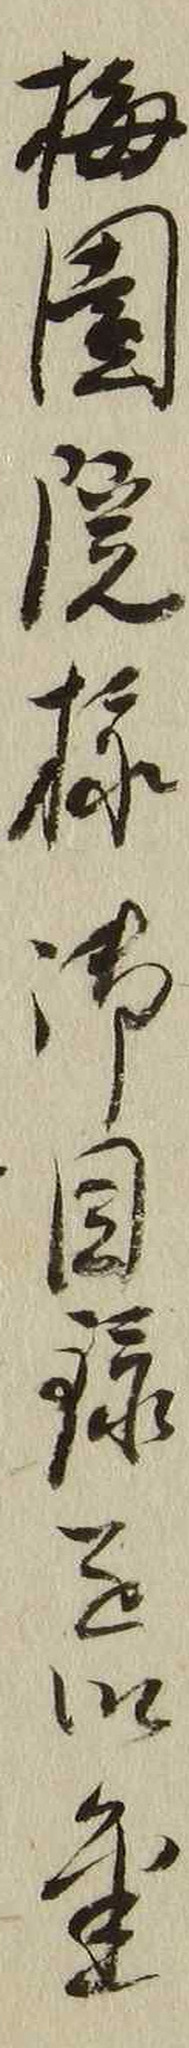梅園院様御目録を以金
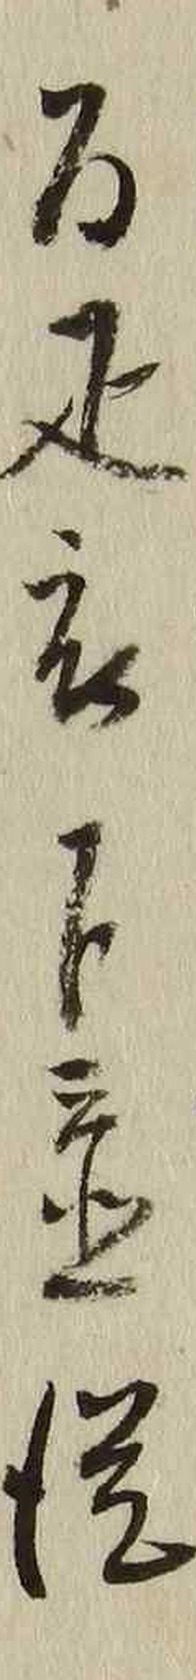百疋被下置従
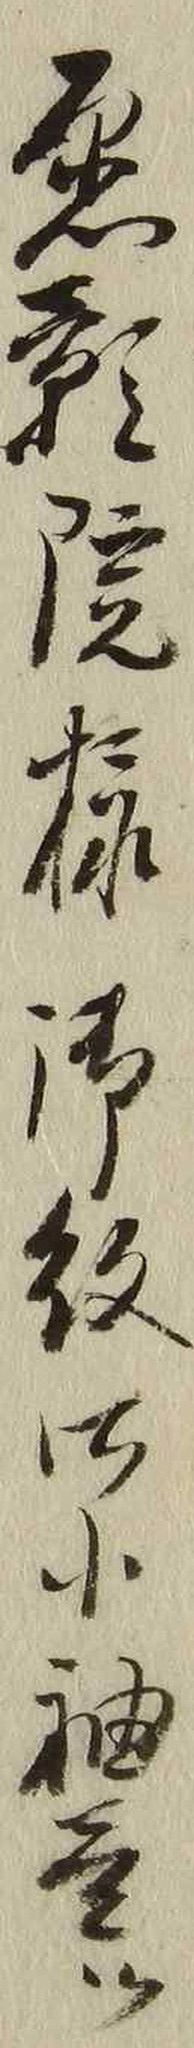愿彰院様御紋御小袖壱ツ
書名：諸士系譜　巻之355　す之部5
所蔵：会津若松市立会津図書館
